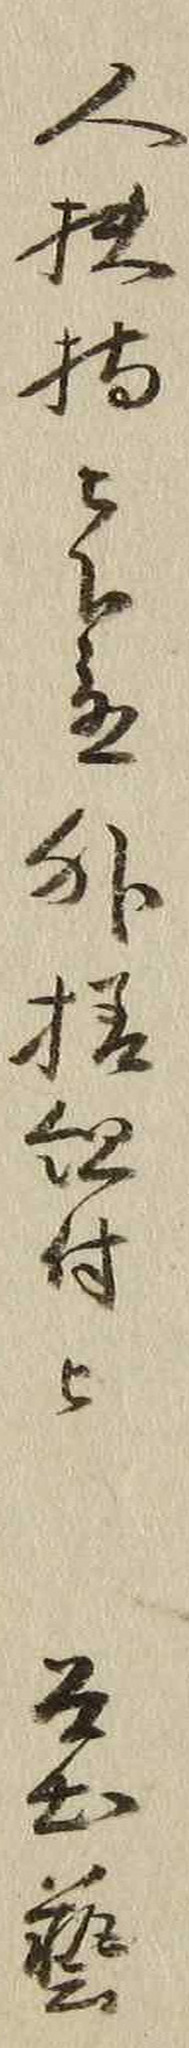人扶持被下置外様組付被召出芸
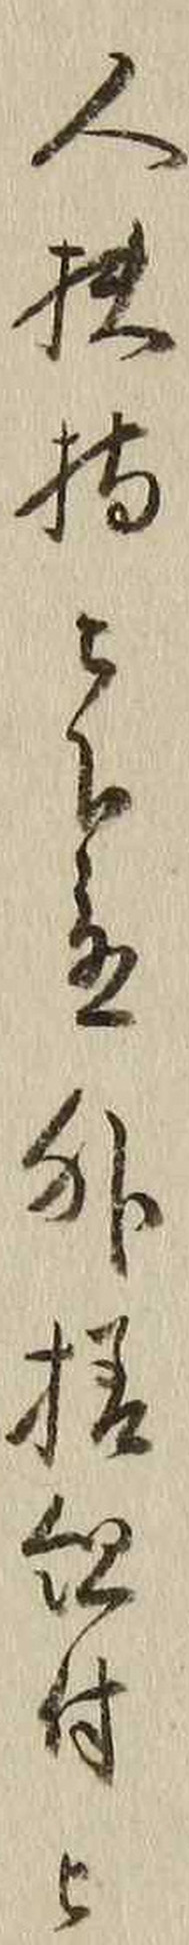人扶持被下置外様組付被召出芸
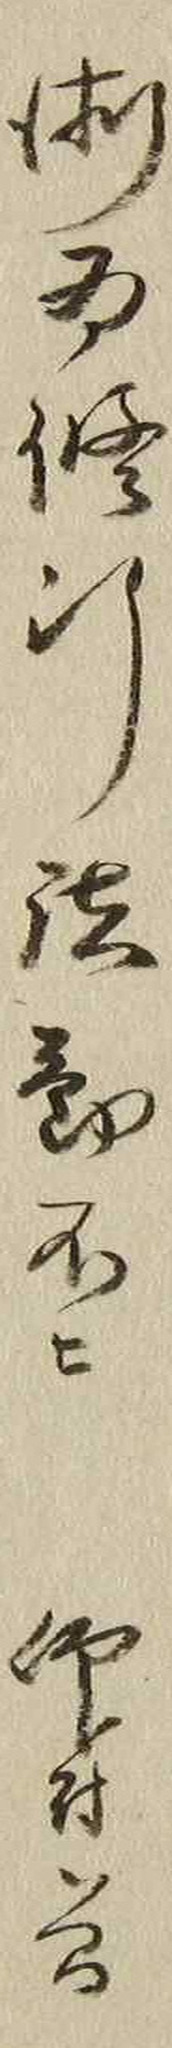術為修行諸勤不被仰付候間
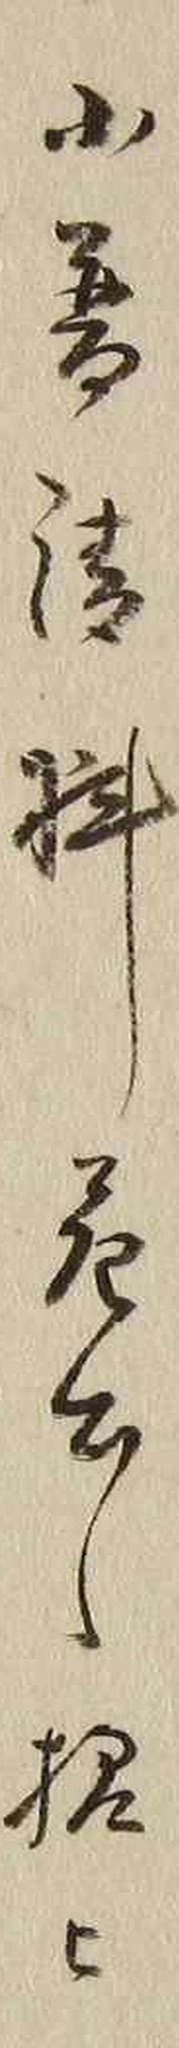小普請料差出候様被
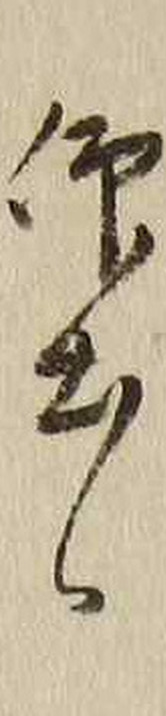仰出候
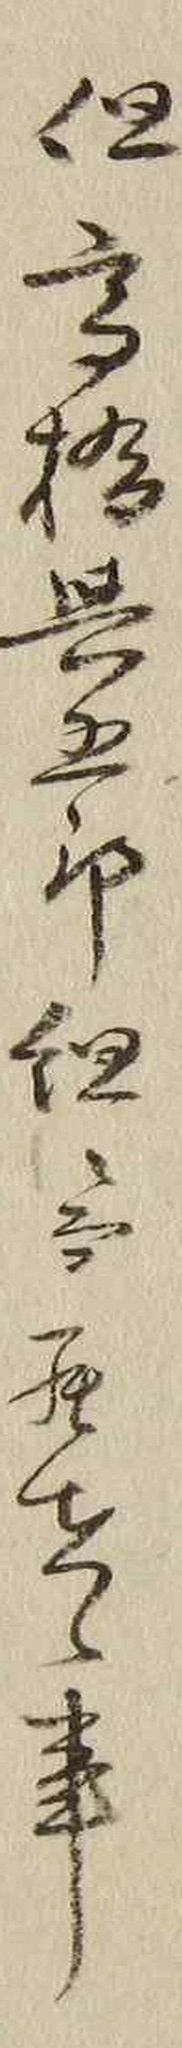但高橋与五郎組ニ而罷在候事
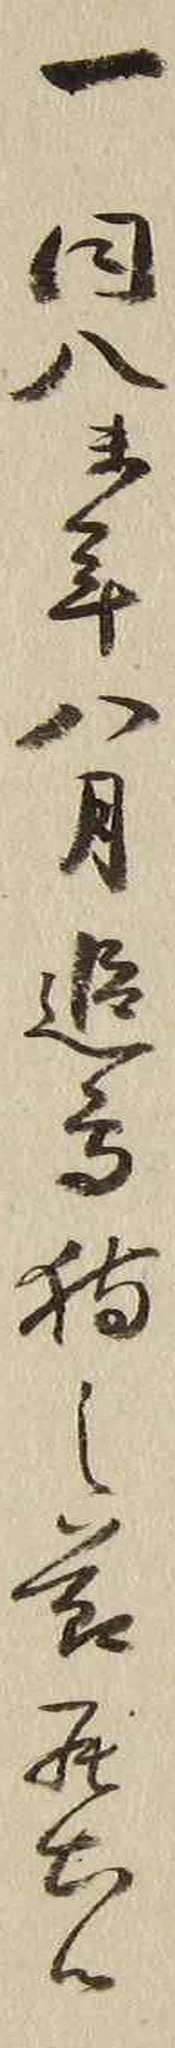一同八未年八月追鳥狩之節罷出候
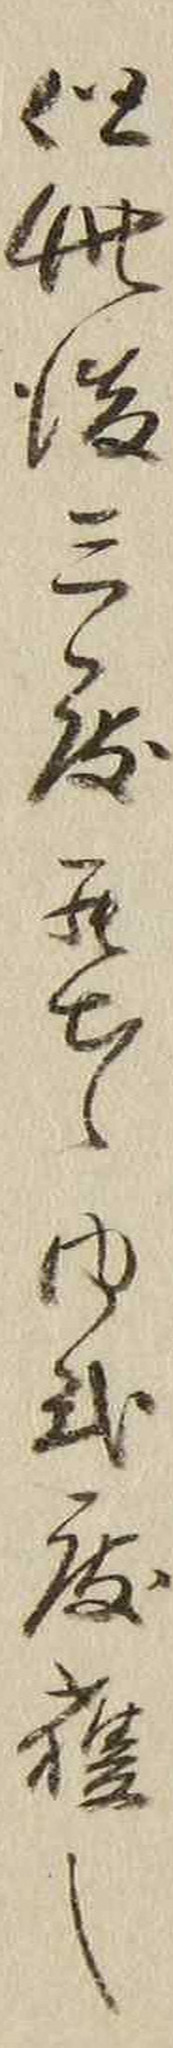但此後三度罷出候内弐度獲之
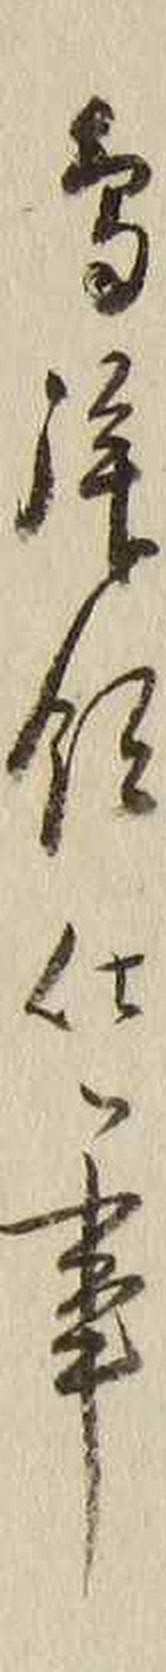鳥拝領仕候事
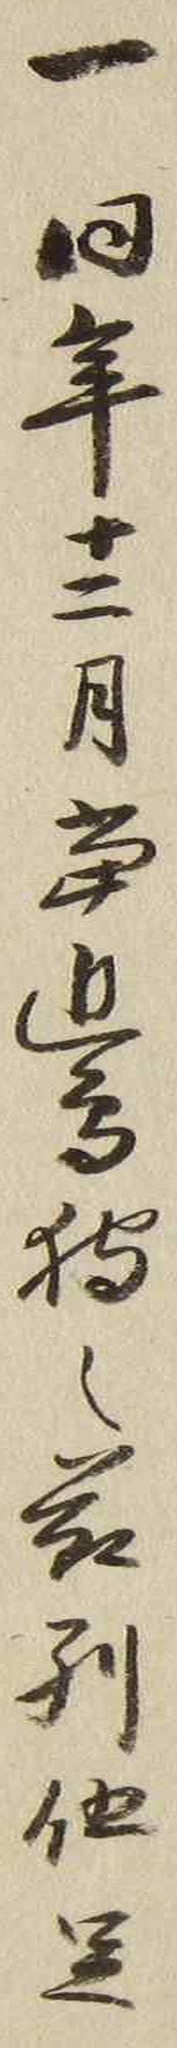一同年十二月当追鳥狩之節列伍足

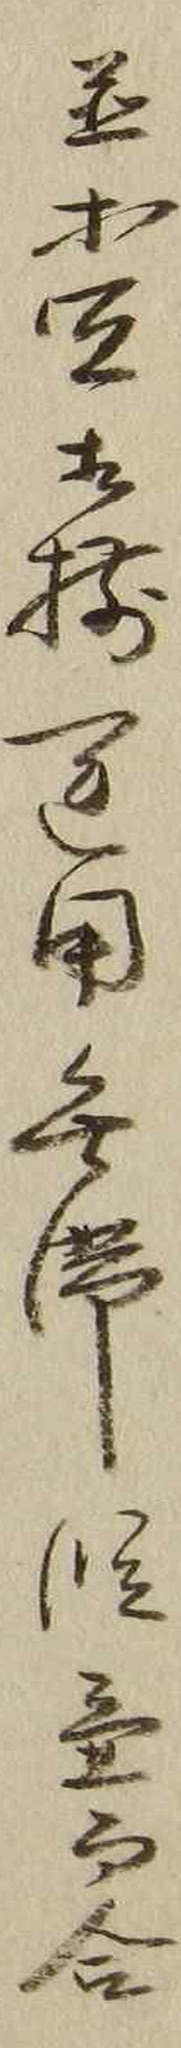並等宜相揃通用無滞候段兼而合
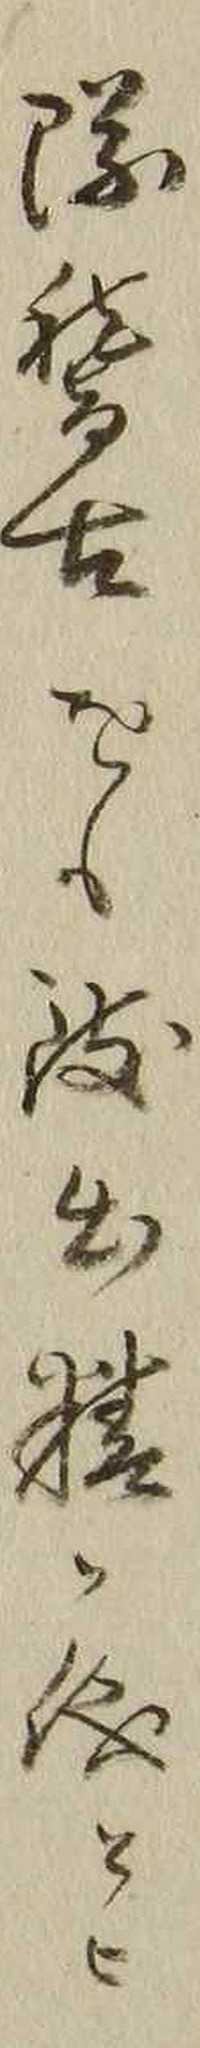隊稽古をも致出精候儀と被
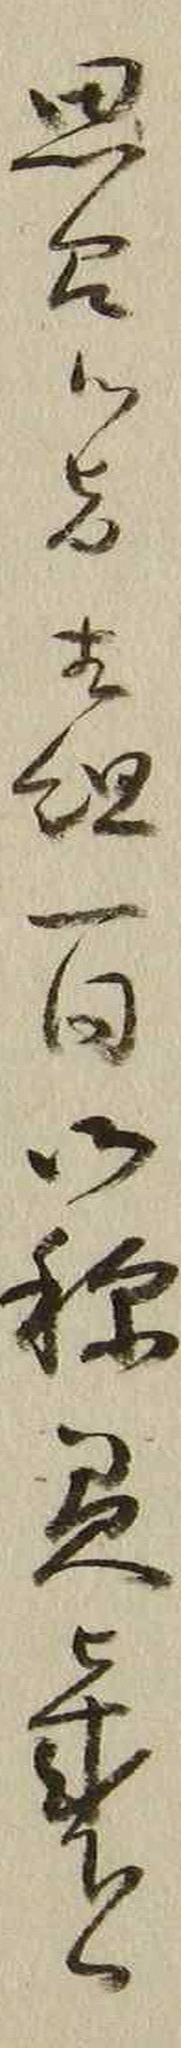思召候旨相組一同御称美被成下候
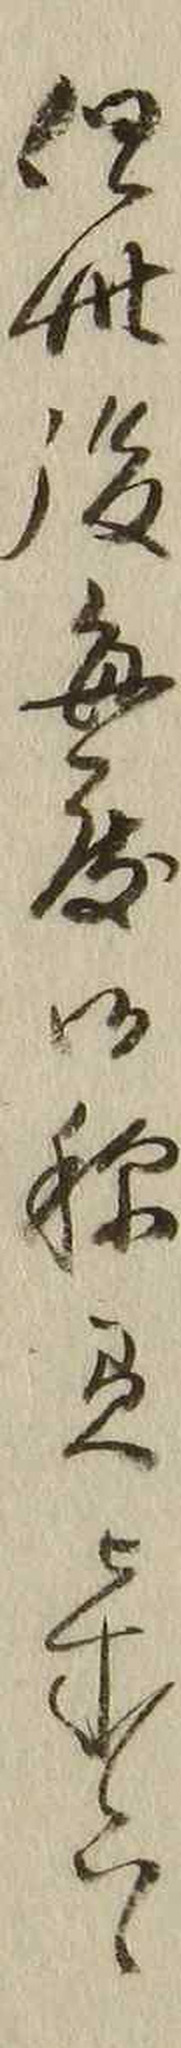但此後毎度御称美被成下候
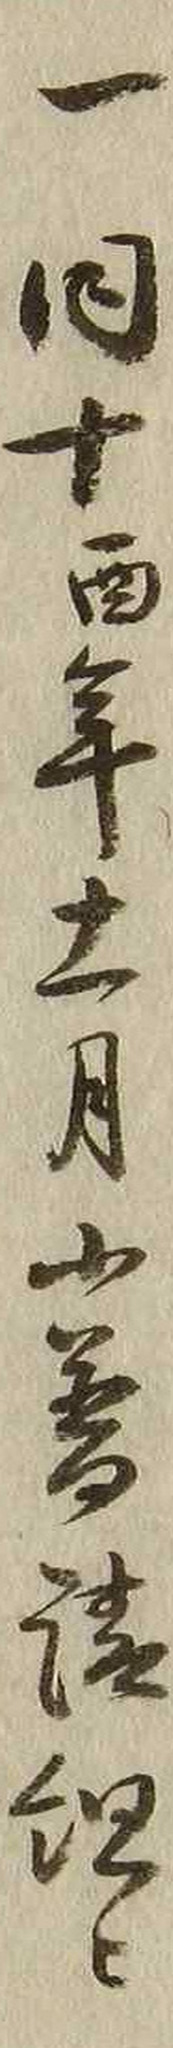一同十酉年十一月小普請組被
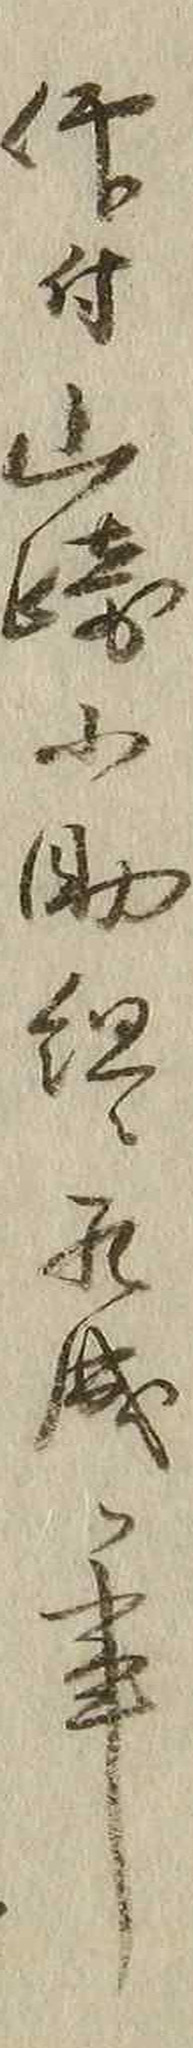仰付山崎小助組ニ罷成候事
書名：諸士系譜　巻之236　ふ之部4
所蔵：会津若松市立会津図書館
